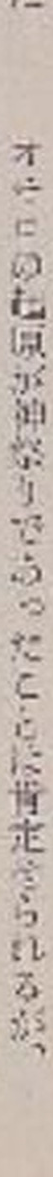オモロの起原が神祭りであったことは肯定せられるが、
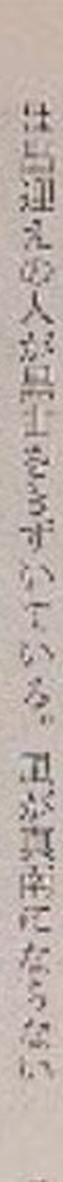は出迎えの人が黒山をきずいている。風が真南にならない
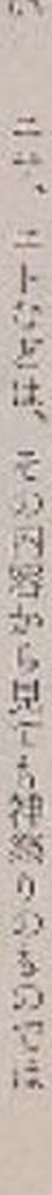エサ、エトなどは、その内容から見ても神祭りのものでは
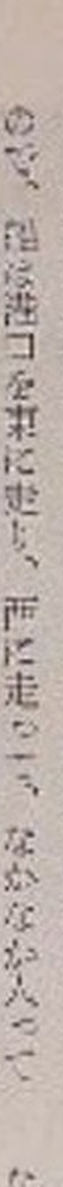ので、船は港口を東に走り、西に走って、なかなか入って
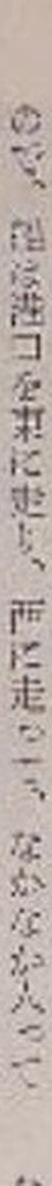ので、船は港口を東に走り、西に走って、なかなか入って
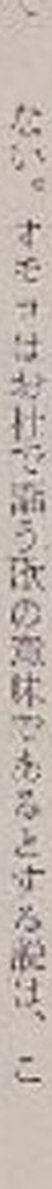ない。オモロはお杜で謡う歌の意味であるとする説は、こ
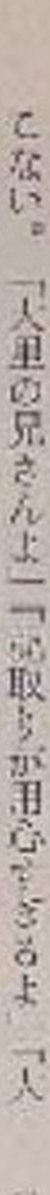こない。「大里の兄さんよ」「楫取りが用心すぎるよ」「大
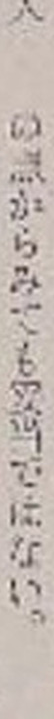の点からみても妥当ではない。
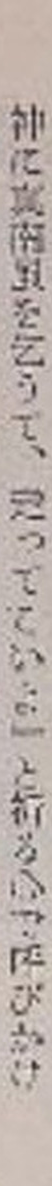神に真南風を乞うて、走ってこいよ」と祈る心で呼びかけ
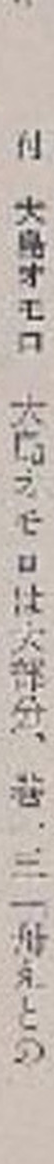付大島オモロ大島オモロは大部分、巻一三「舟えとの
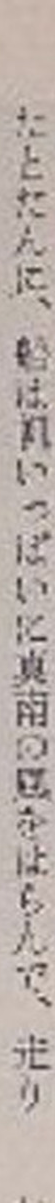たとたんに、船は帆いっぱいに真南の風をはらんで、走り
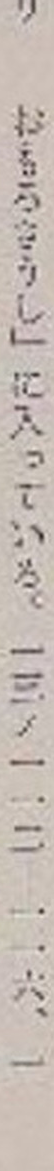おもろさうし」に入っている。一三ノ一一二―一一六、一
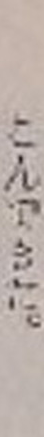こんできた。
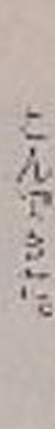こんできた。
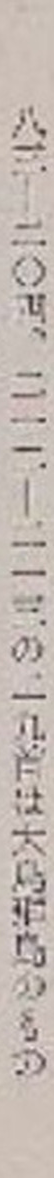八三―二〇四、二一二―二一三の二九首は大島群島のもの
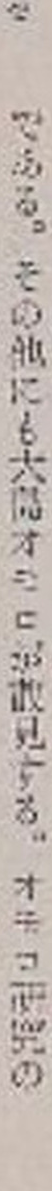である。その他にも大島オモロが散見する。オモロ研究の
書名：沖縄口承文芸
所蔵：University of the Ryukyus Library
